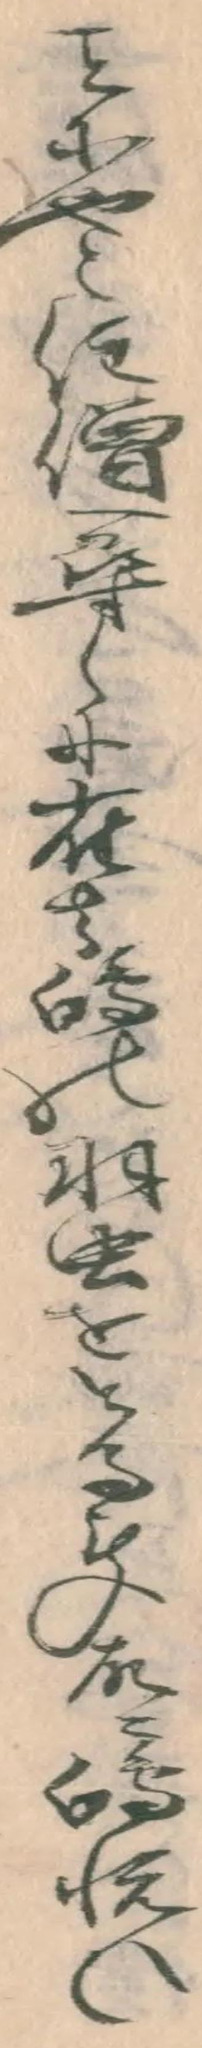ことにやと住僧へ尋しに雀其鴻の羽虫をとるもの故に鴻悦ひ
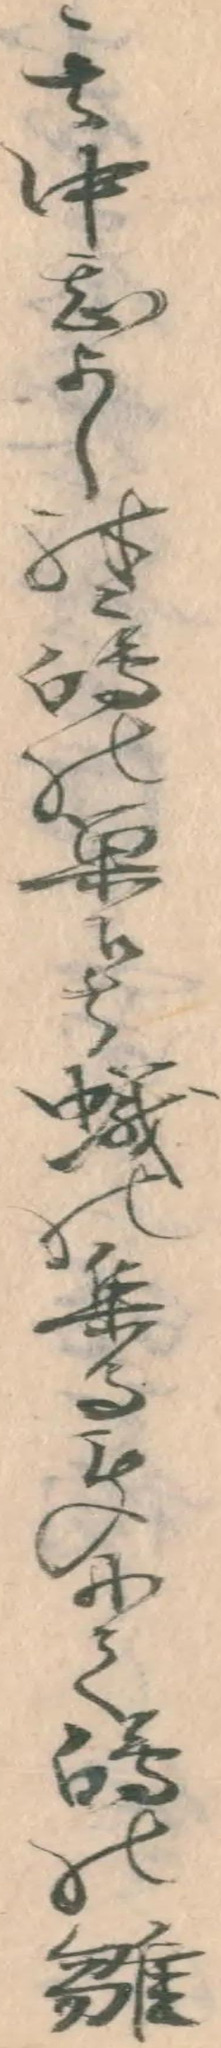其中甚よし殊に鴻の巣えは蟻の集るものにて鴻の雛
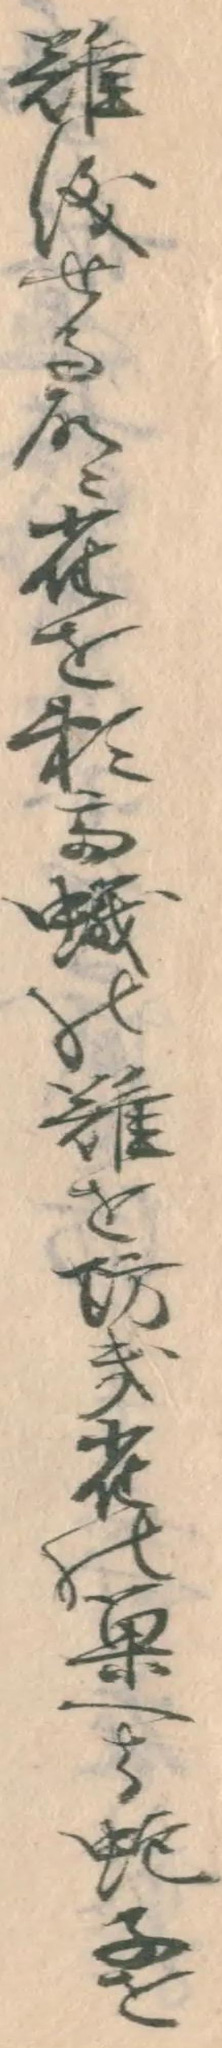難儀せる故に雀を頼て蟻の難を防き雀の巣へっは蛇子を
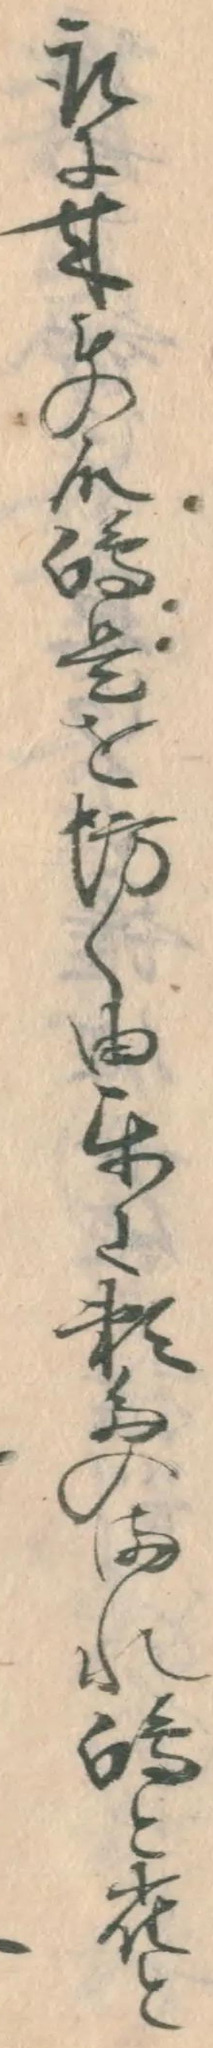取に来もの故鴻是を防く由互に頼たのまれ鴻と雀と
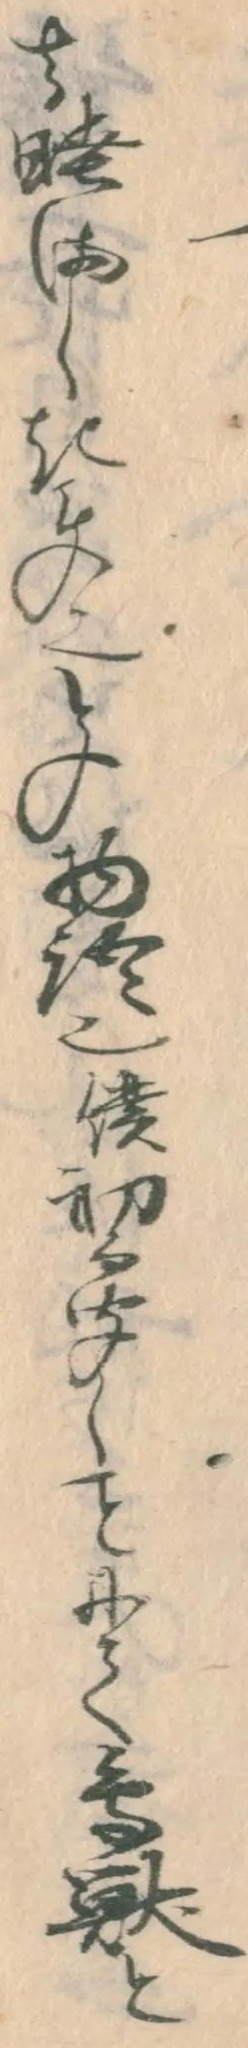其睦ましきもの也との物語也僕初て聞くことにて鳥獣と

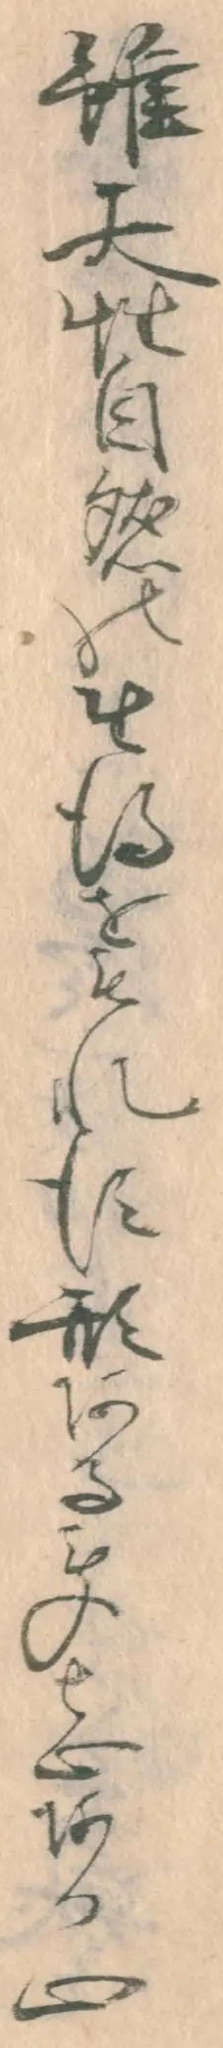雖天性自然の生得をもれす形あるものは心あり心
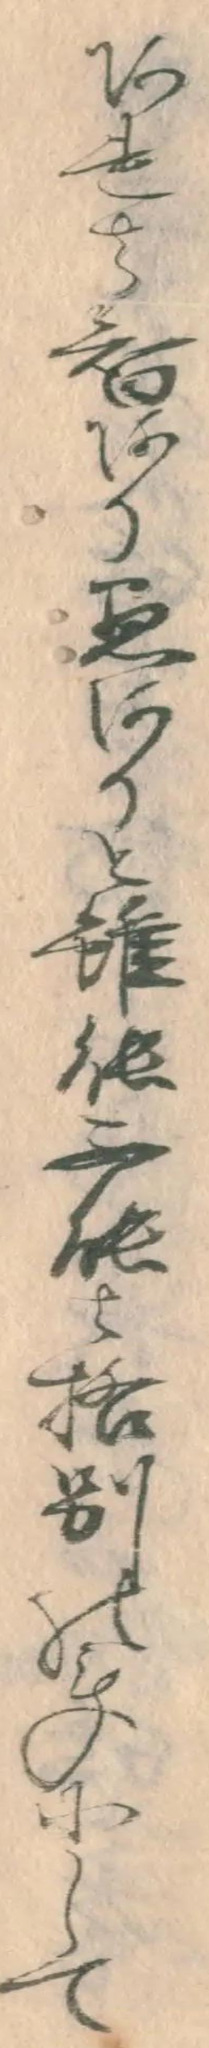あれは智あり愚ありと雖能不能は格別のものにして
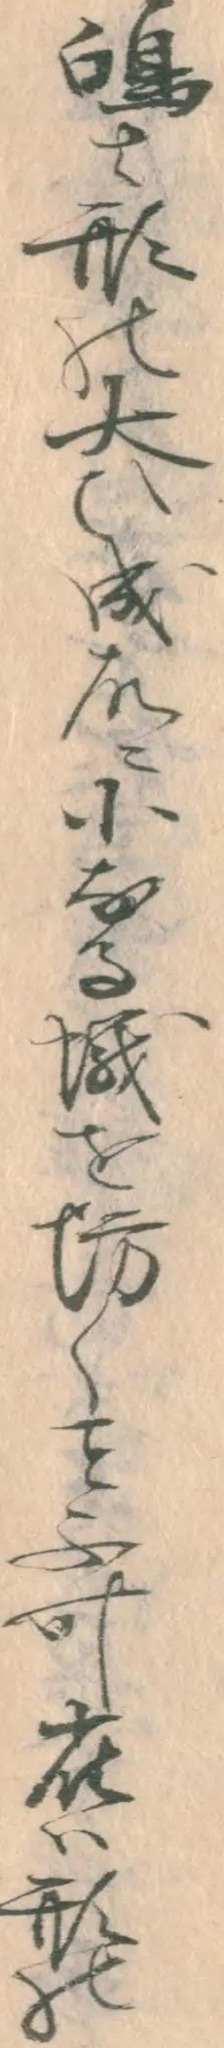鴻は形の大ひ成故に小なる蟻を防くこと不叶雀は形の
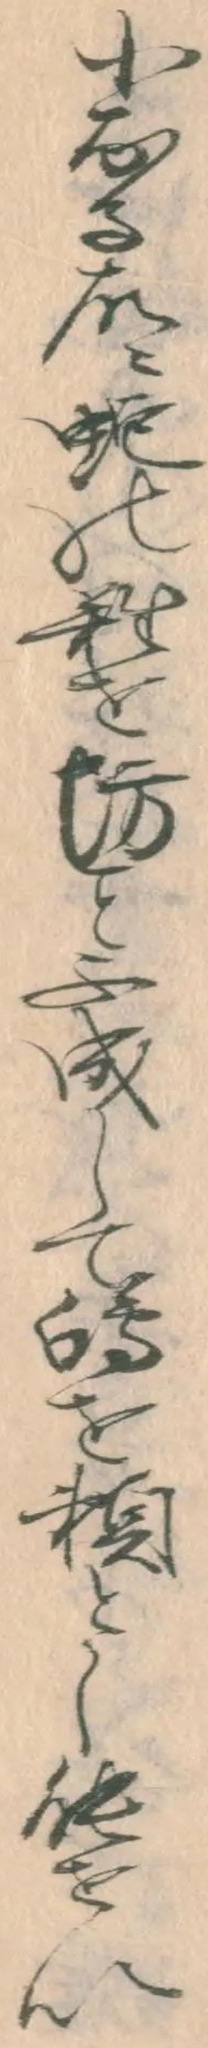小なる故に蛇の難を防こと不成して鴻を頼とし能を以
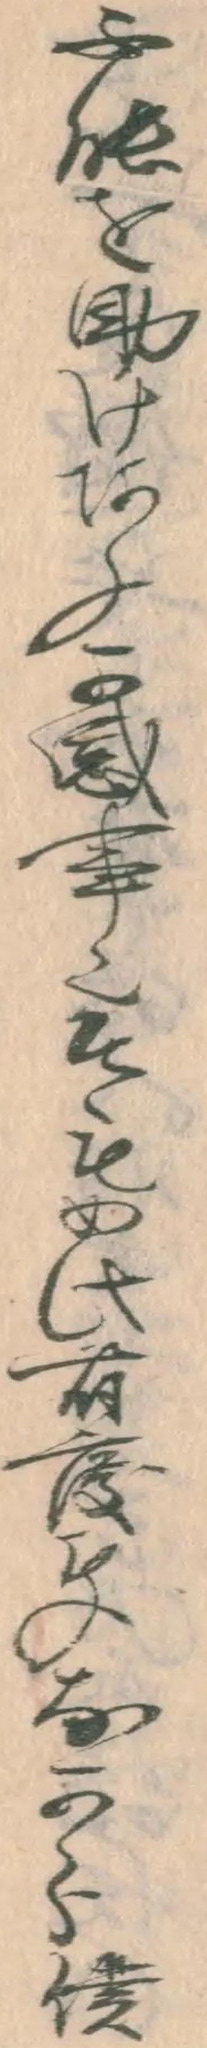不能を助けあふか？感事也そ？も？如此有度ものなから僕
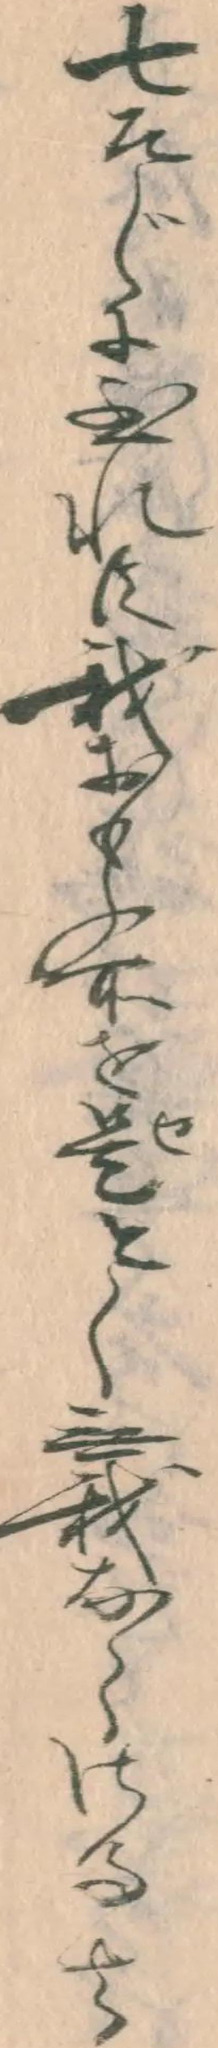七そじに至れ共我おもふ所を是とし無我ならさるは
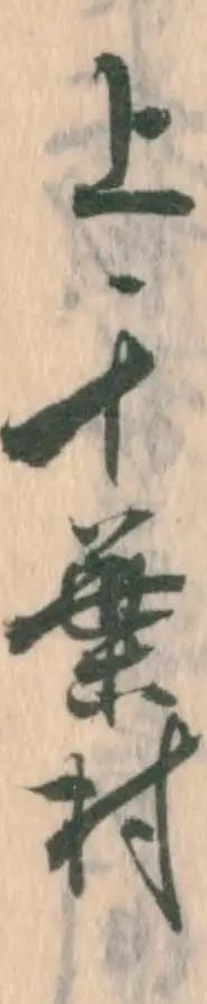上千葉村
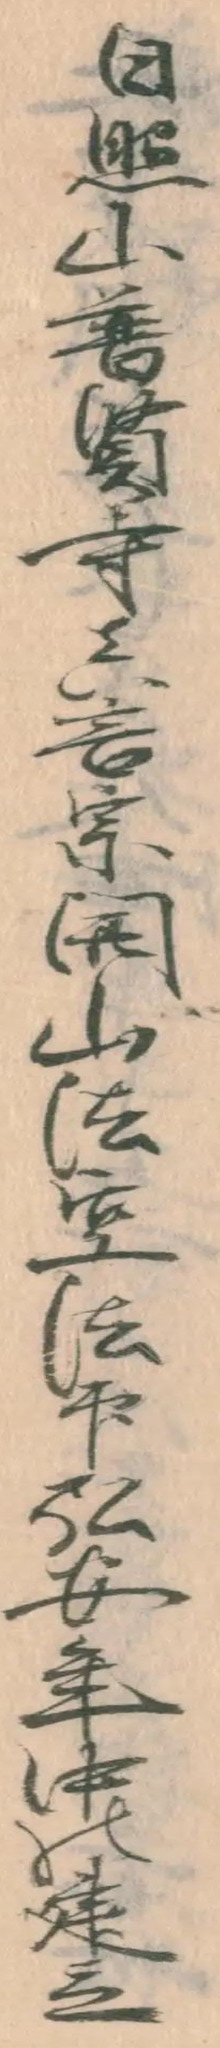日照山普賢寺真言宗開山法空法印弘安年中の建立
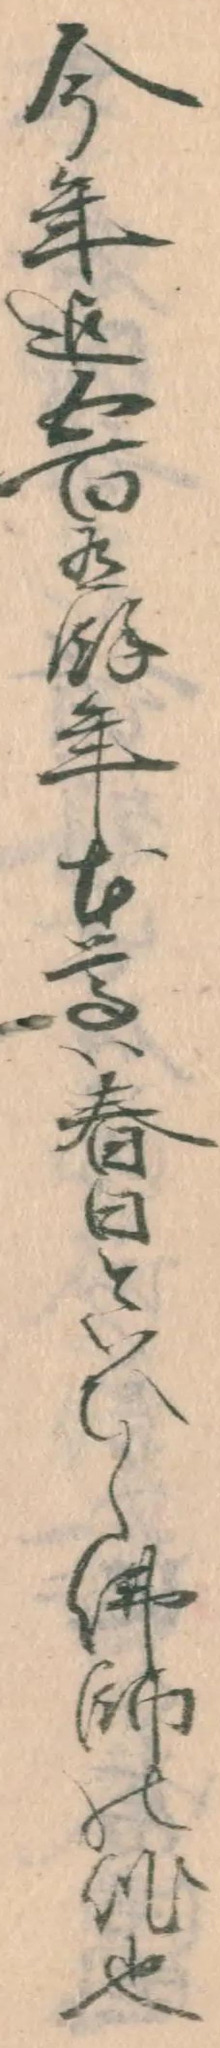今年迄五百有余年本尊は春日といひにて仏師の作也
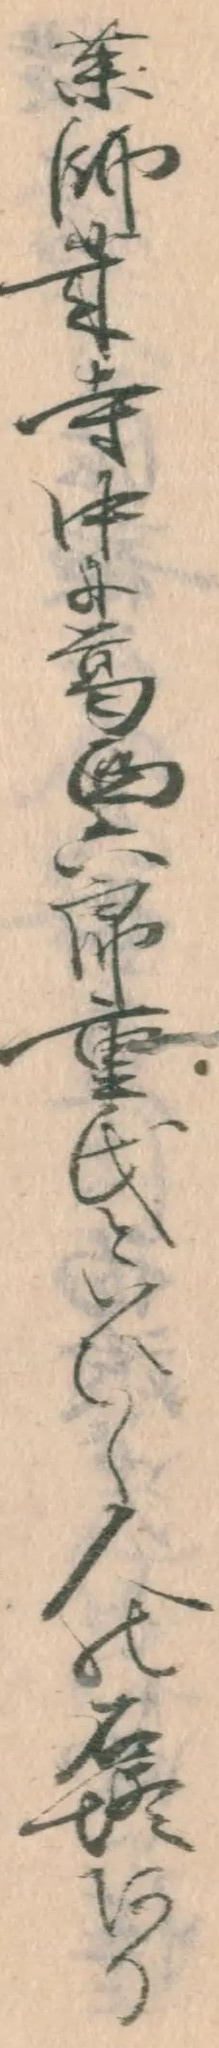薬師如来寺中に葛西六郎重氏といひし人の石塔あり
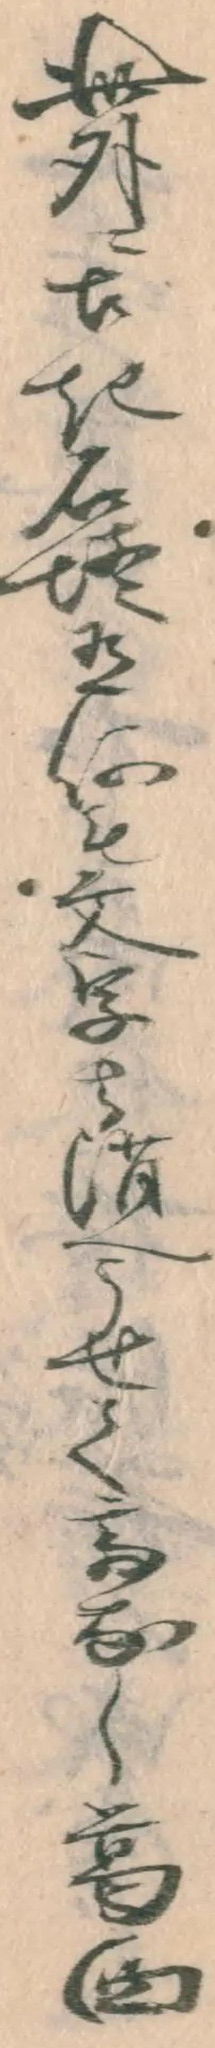此外に古き石塔有何も文字は消へうせてなし葛西
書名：四神地名録 6巻. [4]葛飾郡
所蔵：国立国会図書館 National Diet Library, JAPAN
